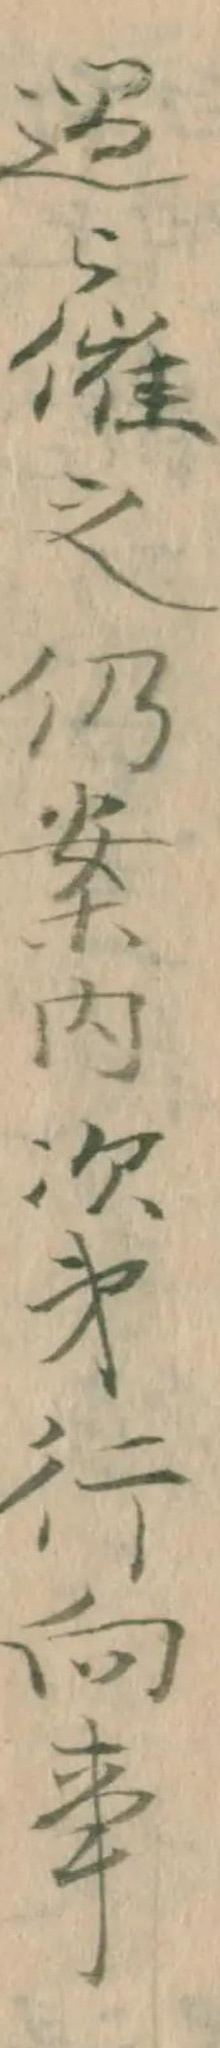遇被催之仍案内次第行向事
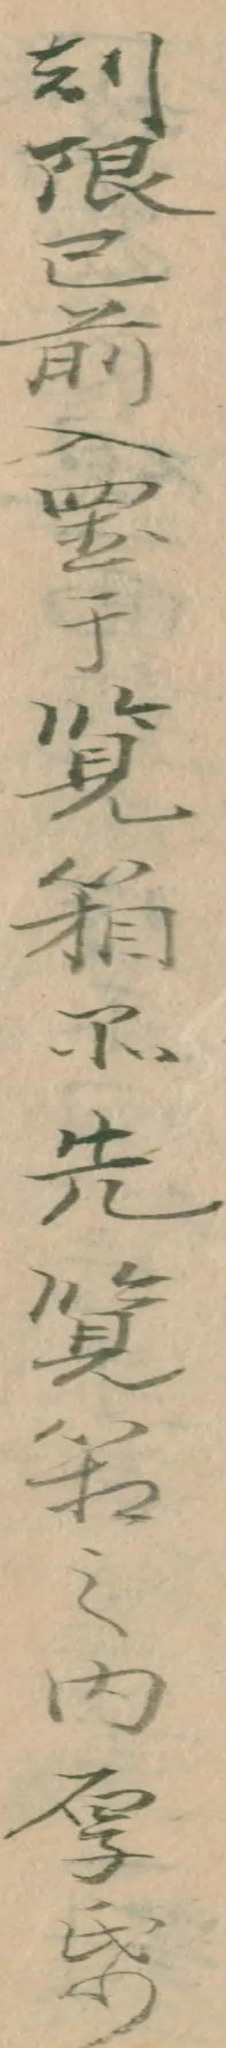一刻限已前入置于覧箱品先覧箱之内厚紙

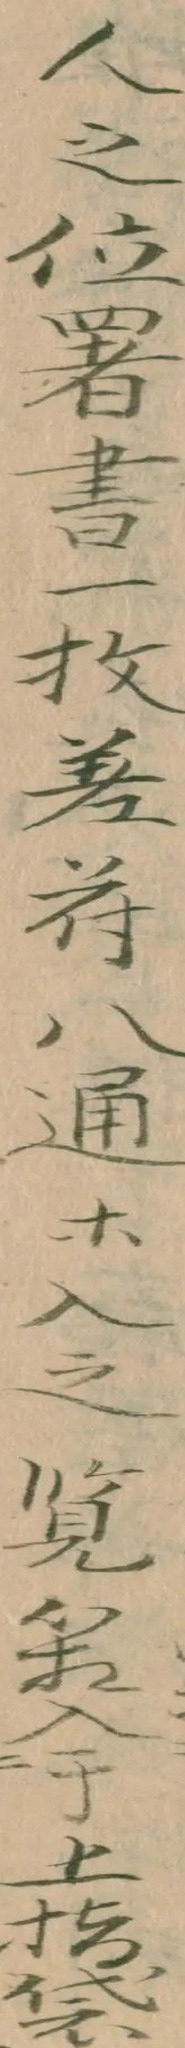人之位署書一枚差符八通等入之覧箱入于上指袋
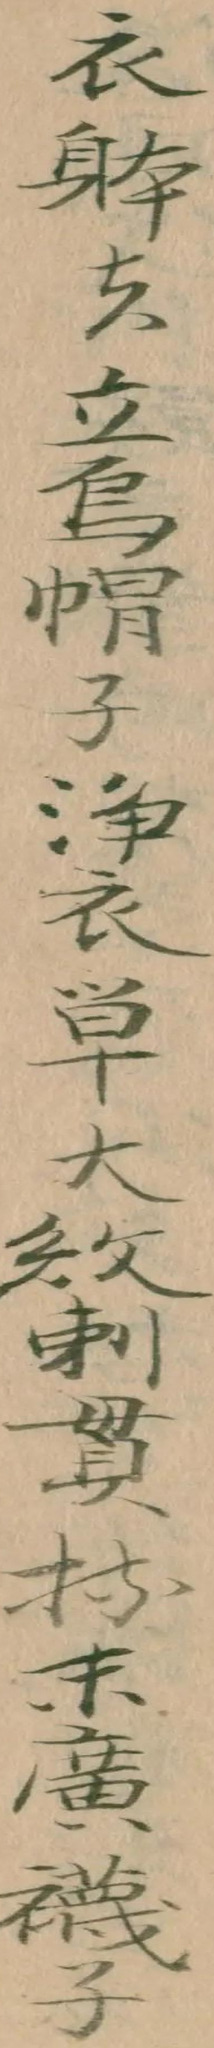一衣体は立烏帽子浄衣単大紋剌貫持末広襪子
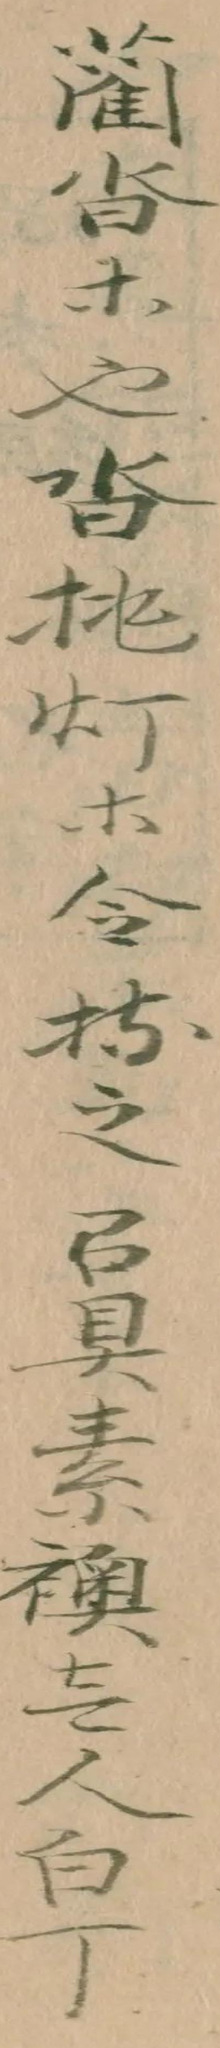藺沓等也沓桃灯等令持之召具素襖壱人白丁
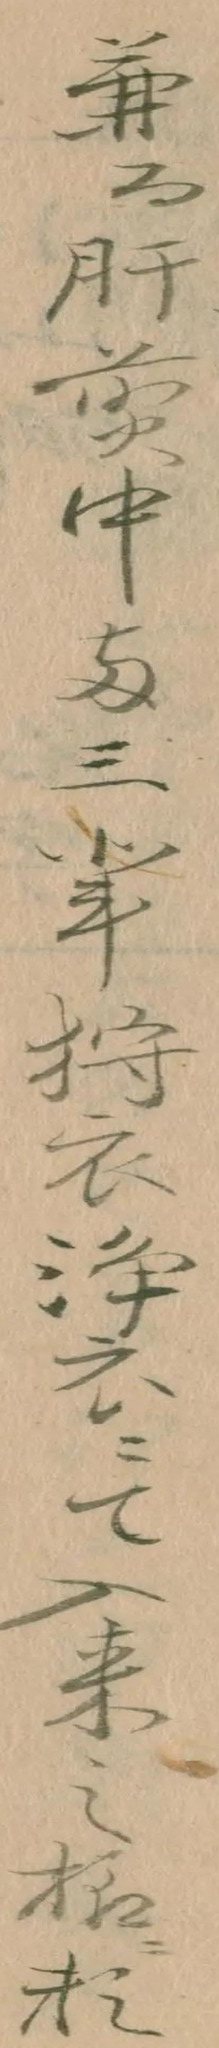一兼而肝煎中両三輩狩衣浄衣ニて入来之様ニ頼
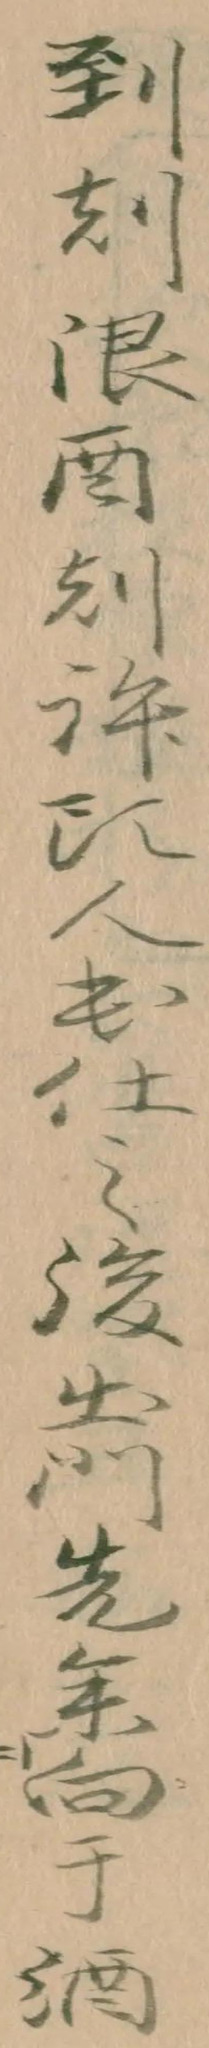一到刻限酉刻許頭人出仕之後出門先参-向于酒
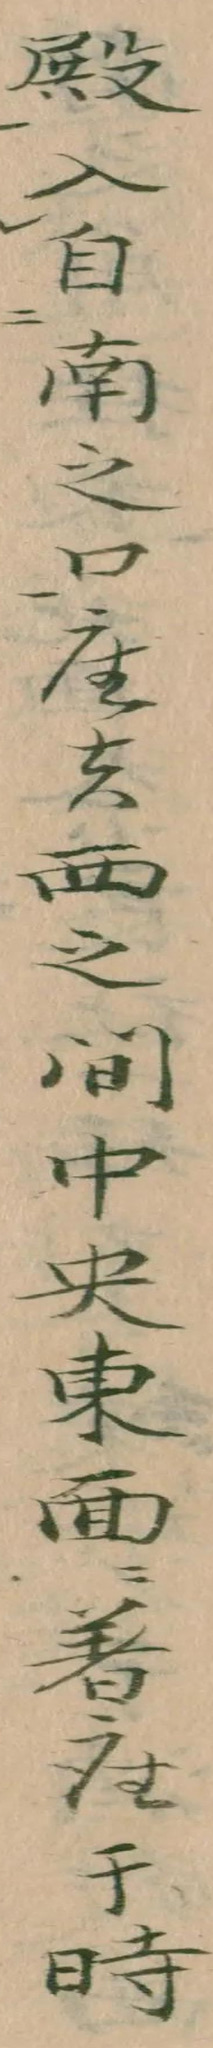殿入自南之口座は西之間中央東面ニ着座于時

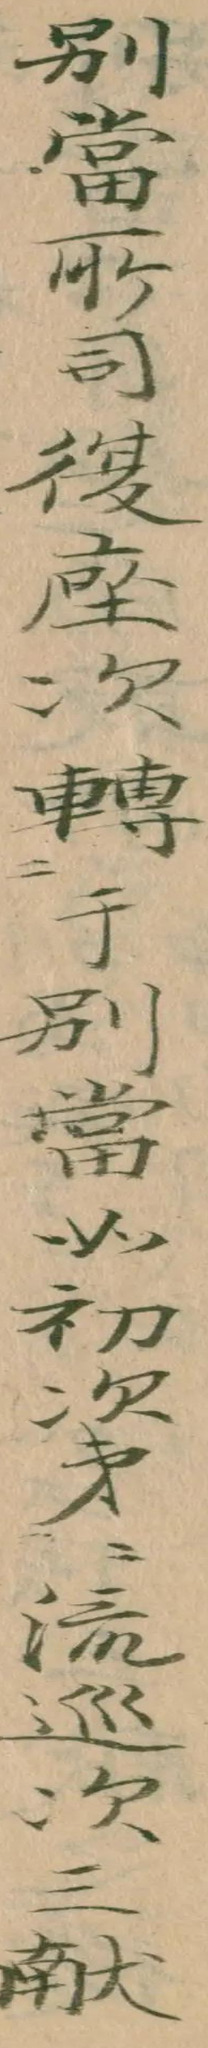別当所司復座次転于別当如初次第ニ流巡次三献
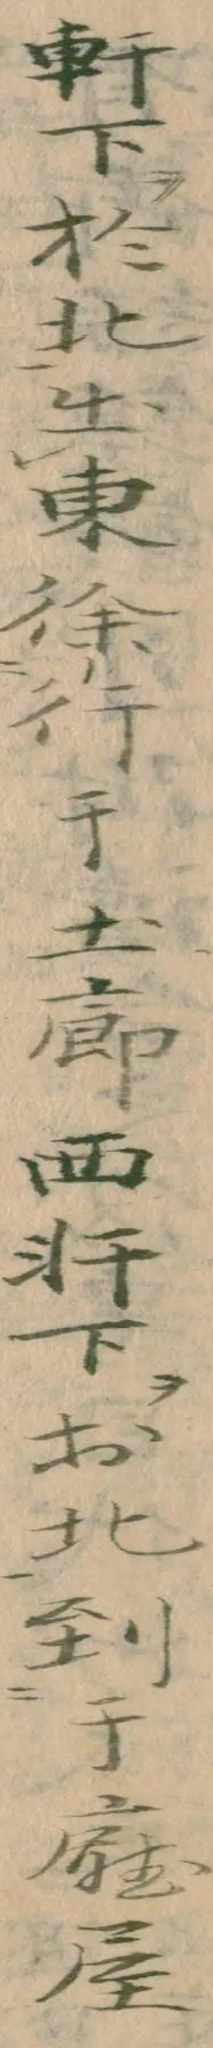軒下ヲ於北出東徐-行于土廊西軒下ヲ於北于庁屋
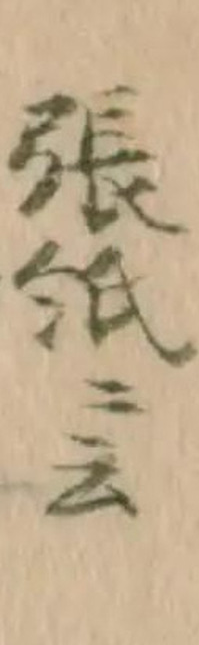張紙ニ云
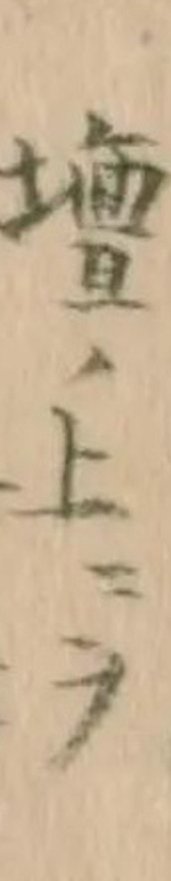壇ノ上ニヲ
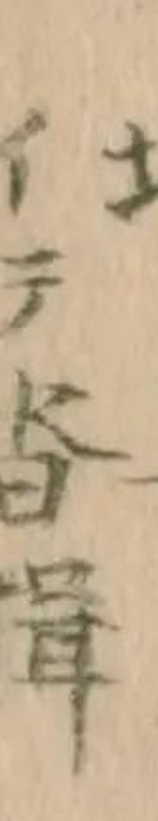イテ沓揖
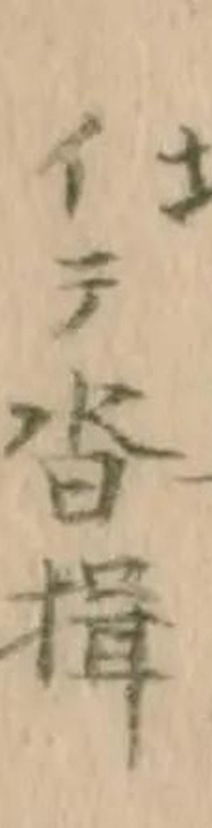イテ沓揖

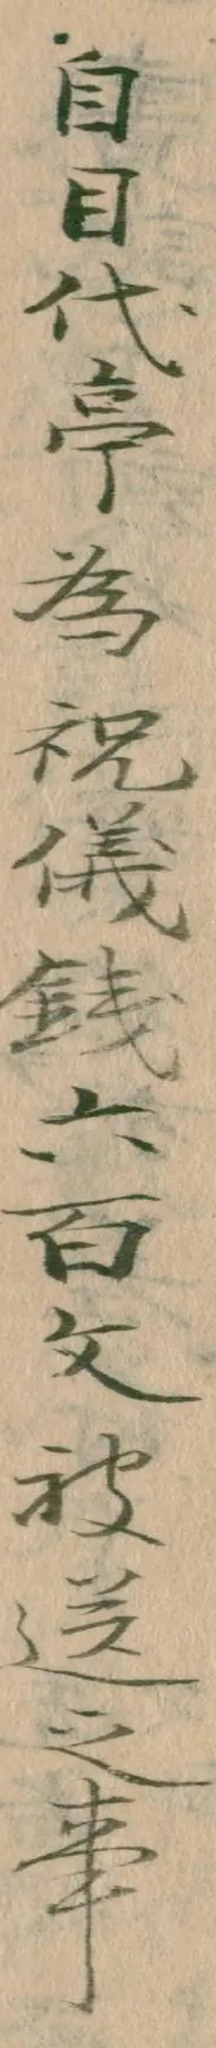一自目代亭為祝儀銭六百文被送之事
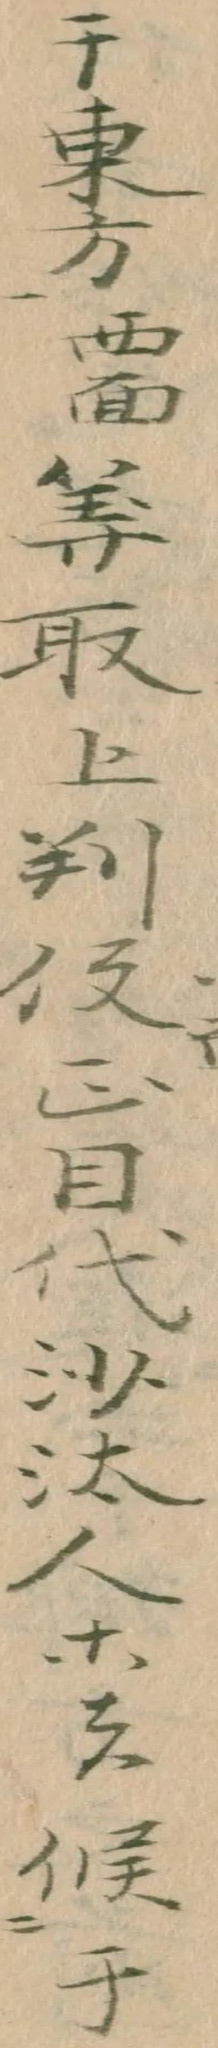于東方西面算取上判役正目代沙汰人等は候于
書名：賀茂社記録. 第26冊
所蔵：国立国会図書館 National Diet Library, JAPAN
